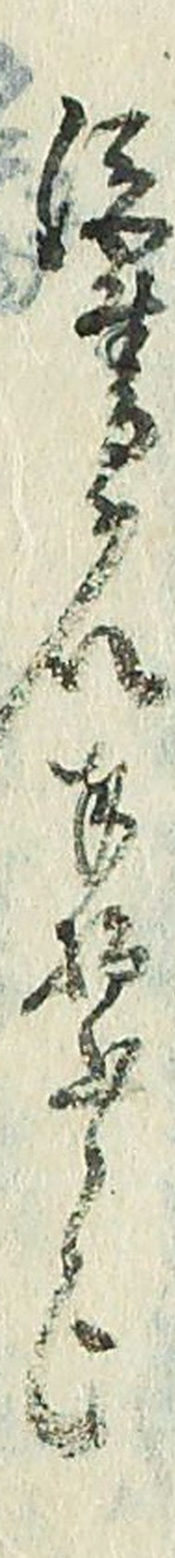添書を以奉指上候以上
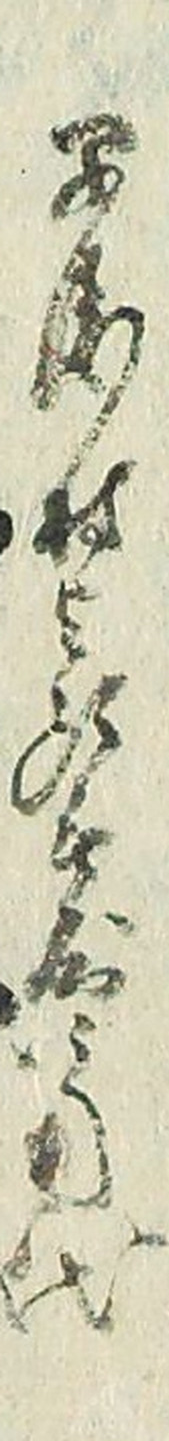早渕村与頭庄屋御用代
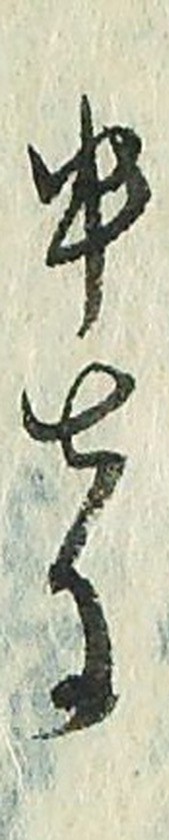申七月
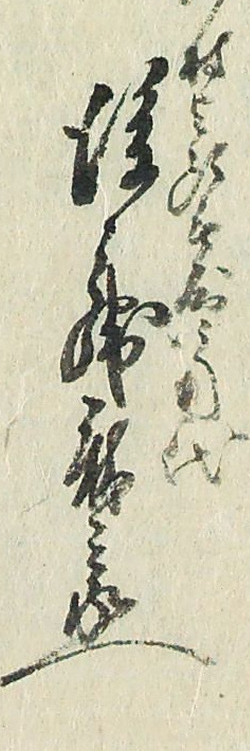後藤麻之丞
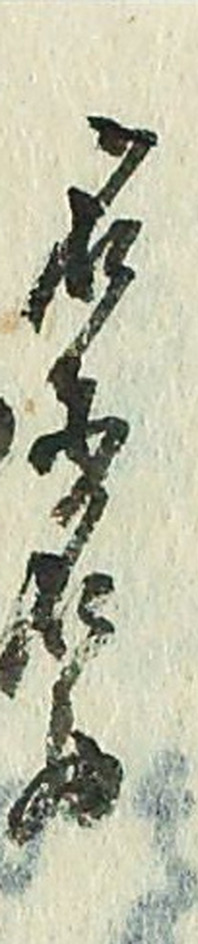名東名西
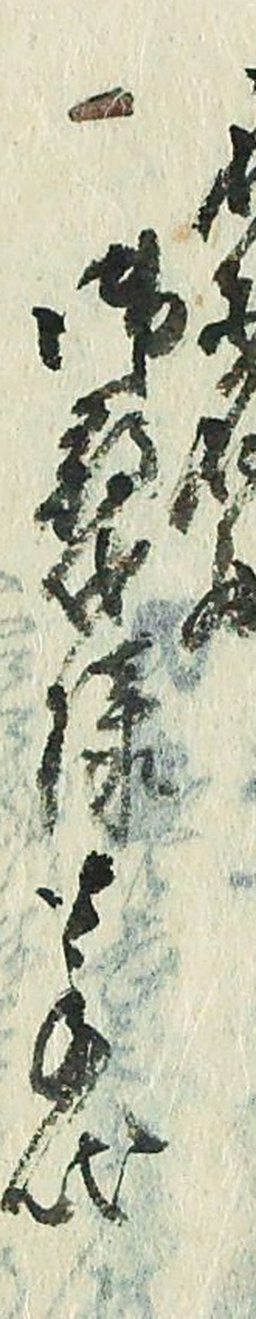御郡代様御手代
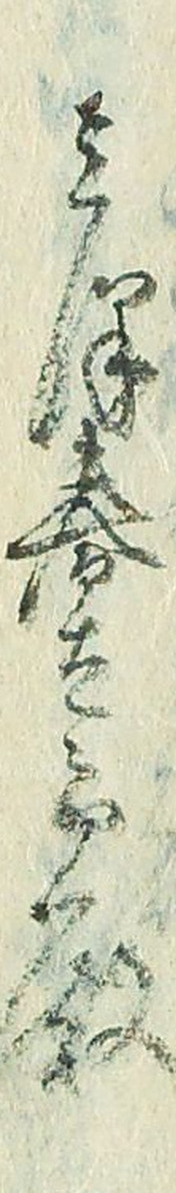三沢春太郎殿
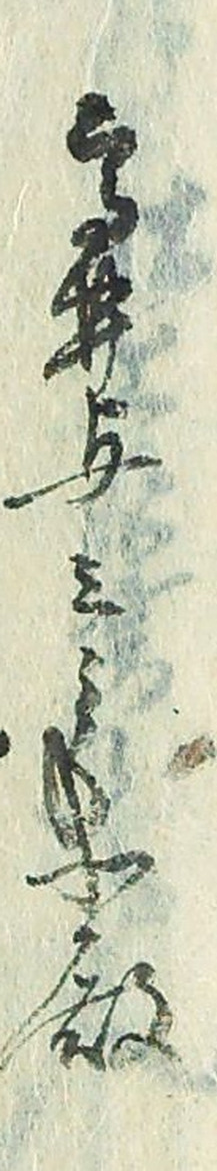高井与三兵衛殿
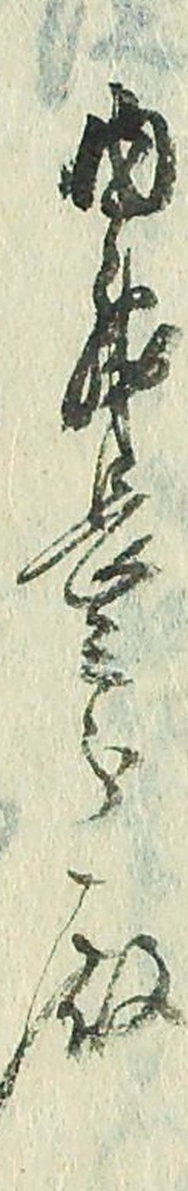内藤長三郎殿
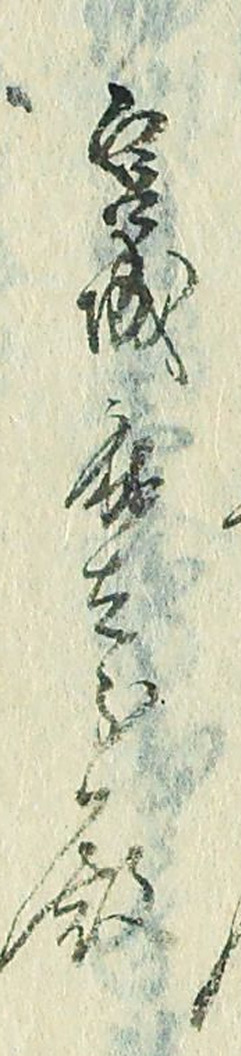宮城麻太郎殿
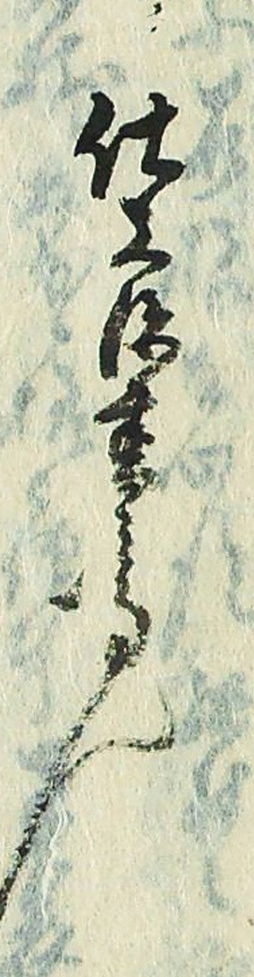仕上添書之覚
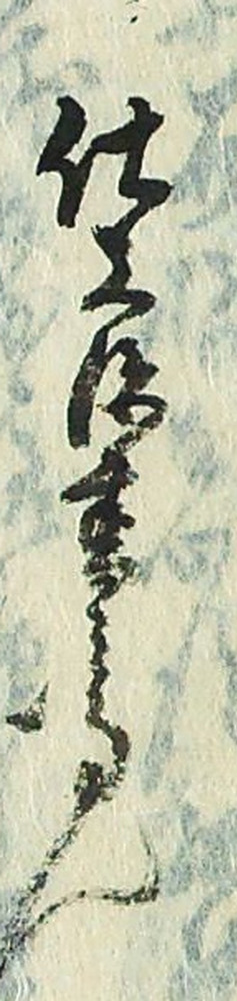仕上添書之覚
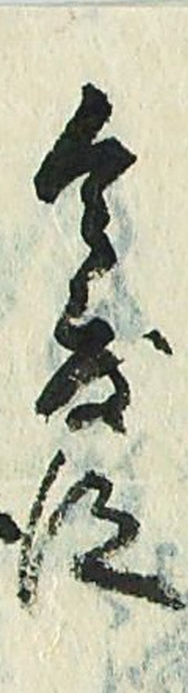今度従
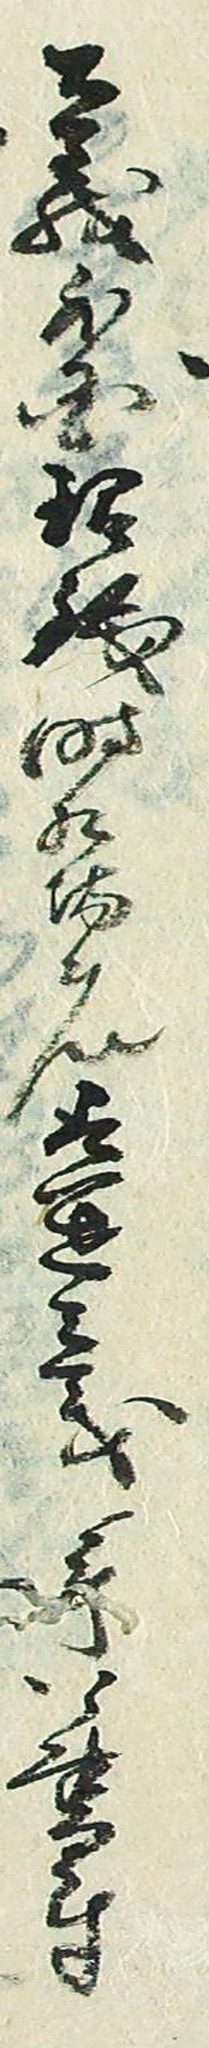公義外国銀銭時相場を以取遣之義に付御書付
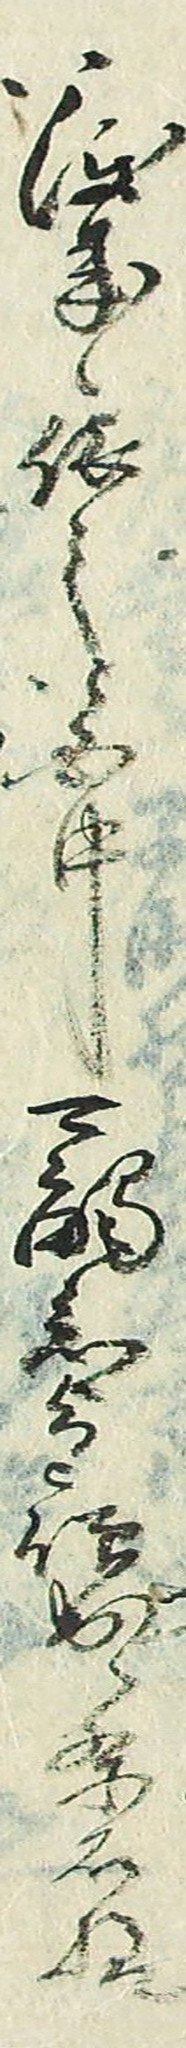御渡成候依之御国中可触知旨被仰出候条右様
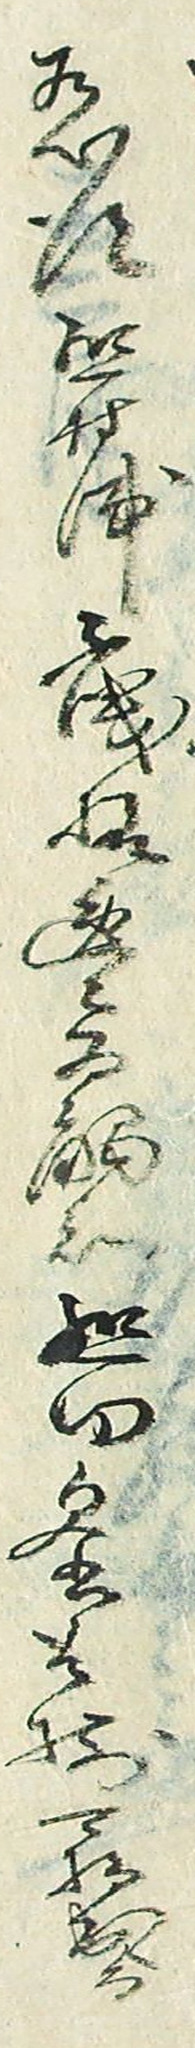相心得組村浦不洩様逸々為触知組切受書取揃可指出旨
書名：諸御用御□受書控
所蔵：鳴門教育大学 Naruto University of Education
